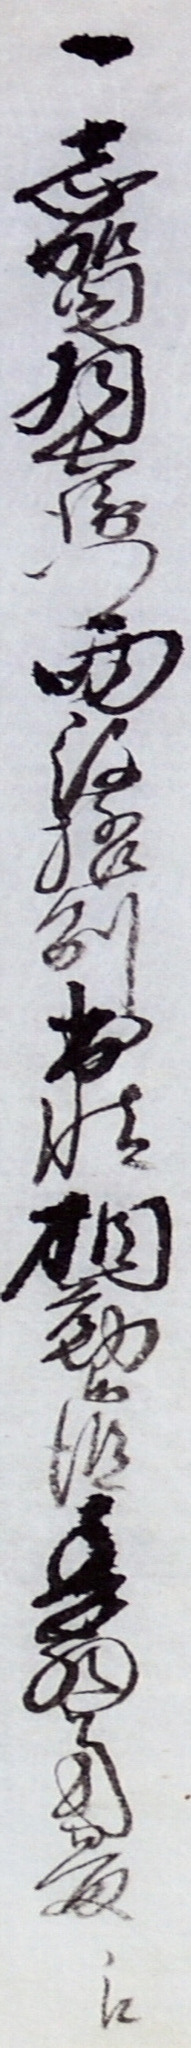一志賀羽右衛門両役格別出精相勤候段手舞御用番江
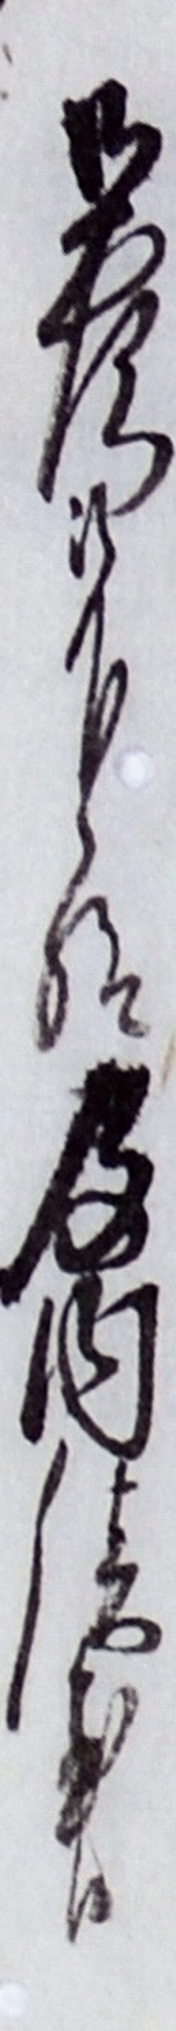御考被下候様及内談置候
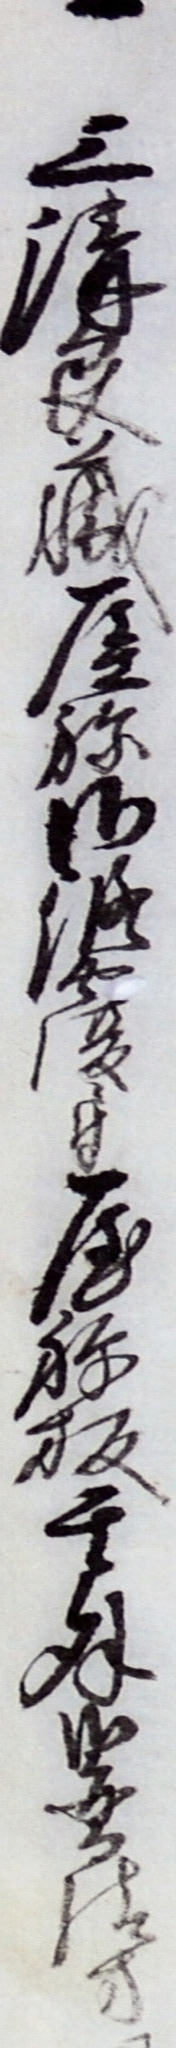一三溝良蔵屋祢御修復ニ付屋祢板其外御普請方ヨリ

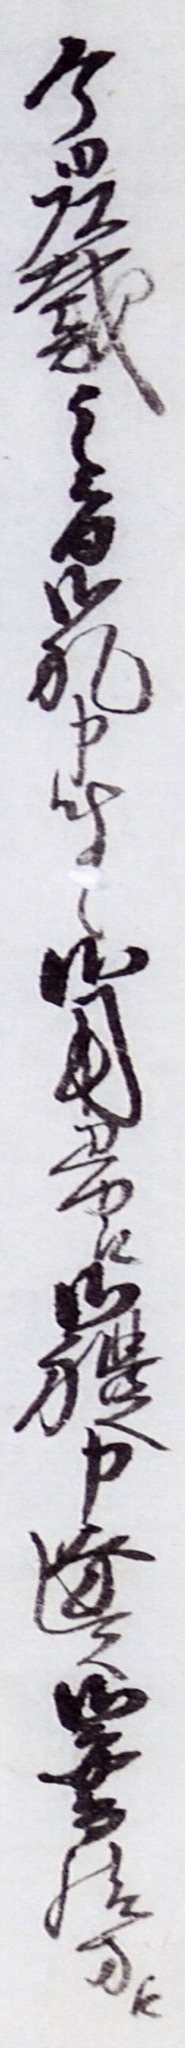今日頂戴之旨御礼申聞候御用番江御禮申達候御普請方江
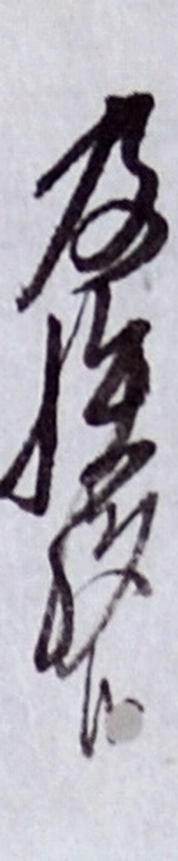及挨拶候
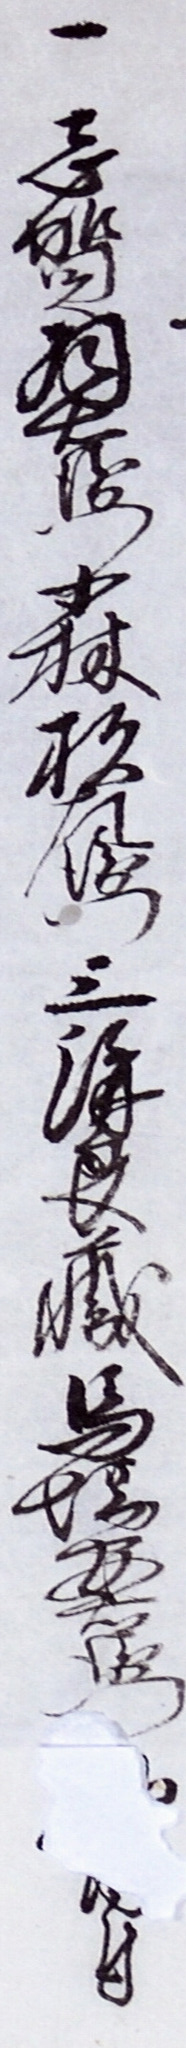一壱志賀羽右衛門小林杉左衛門三溝良蔵馬場安右衛門御目ヵ付
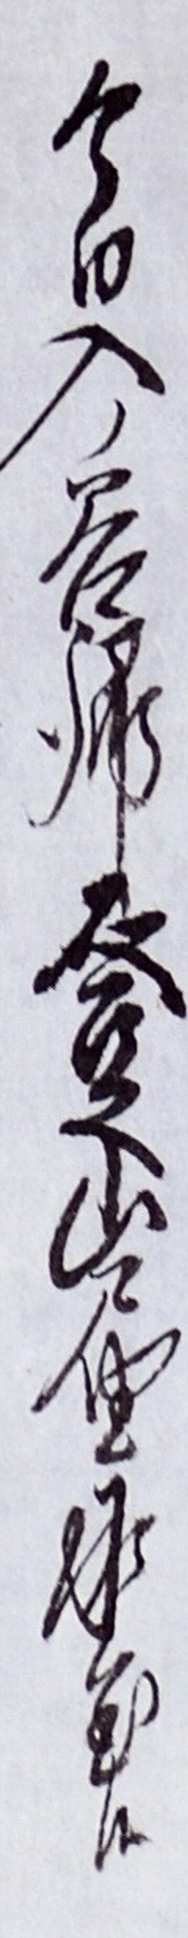今日入ノ谷帰郷登山届承置候
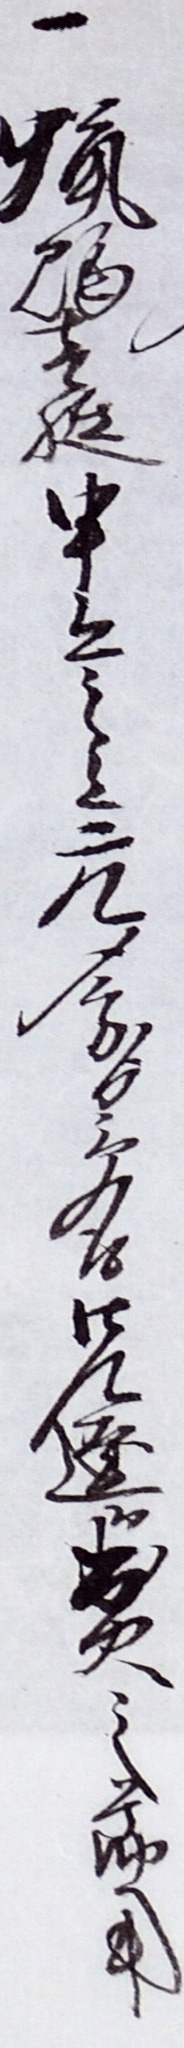一蝋燭壱挺申立之上差元〆方より受取先達而出火之節用
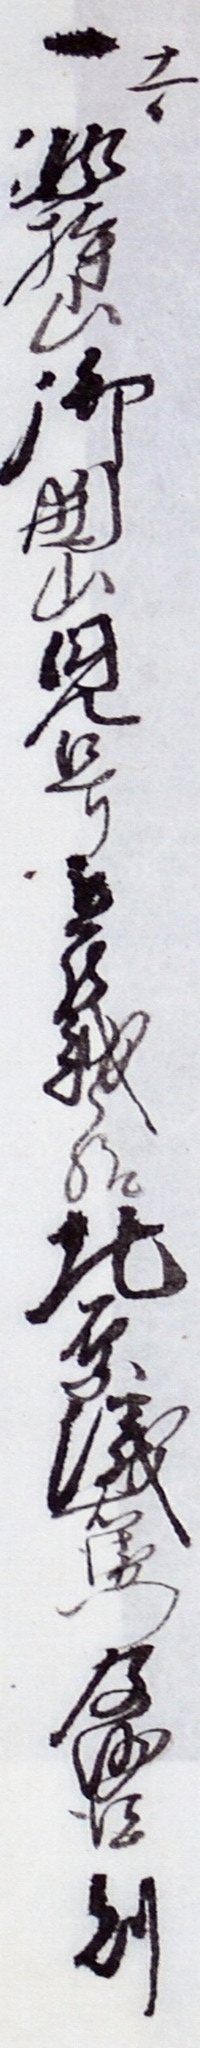一非持山御囲山見廻り被罷越候様北原儀右衛門及沙汰別則
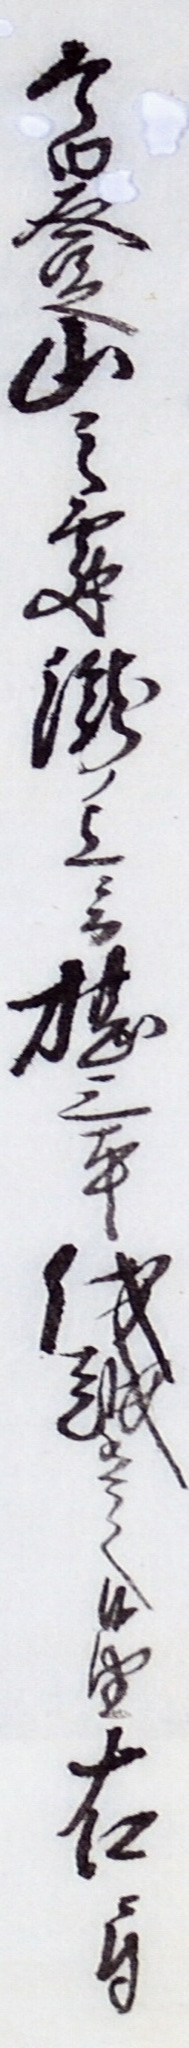今日登山之処瀧ノ上ニ而椹三本伐越有之候由右ニ付
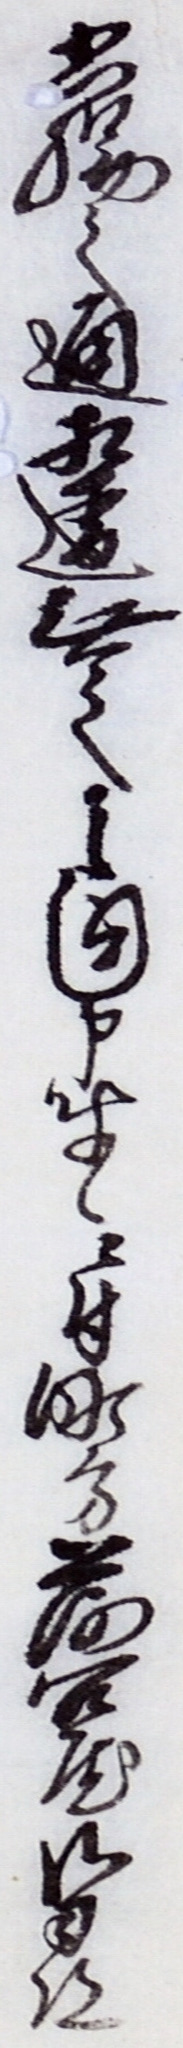書揚之通相違無之趣申聞候ニ付町方荷問屋御用道
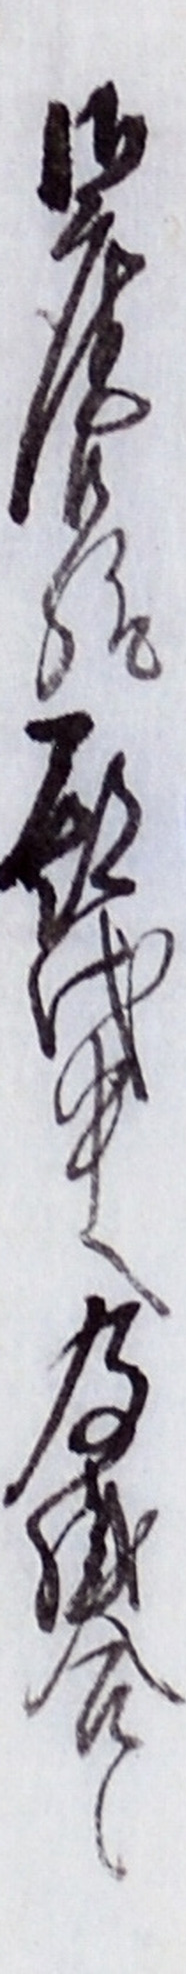御座候様郡代中へ及織掛合候
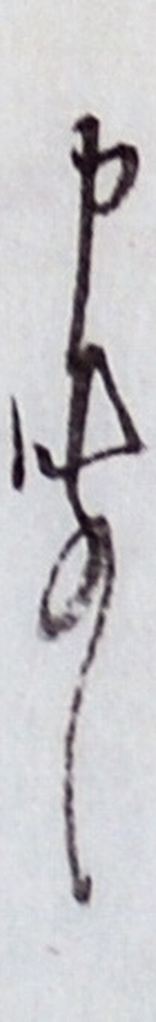申聞候
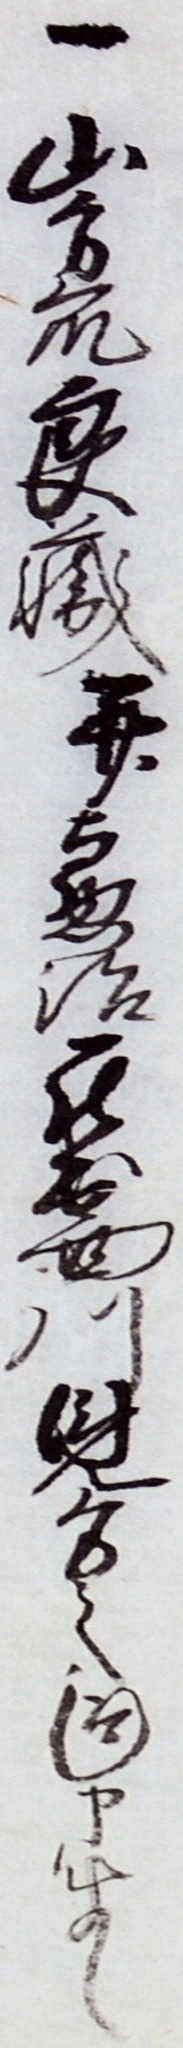一山方衆良蔵并与惣治罷出面川見分之趣申聞候
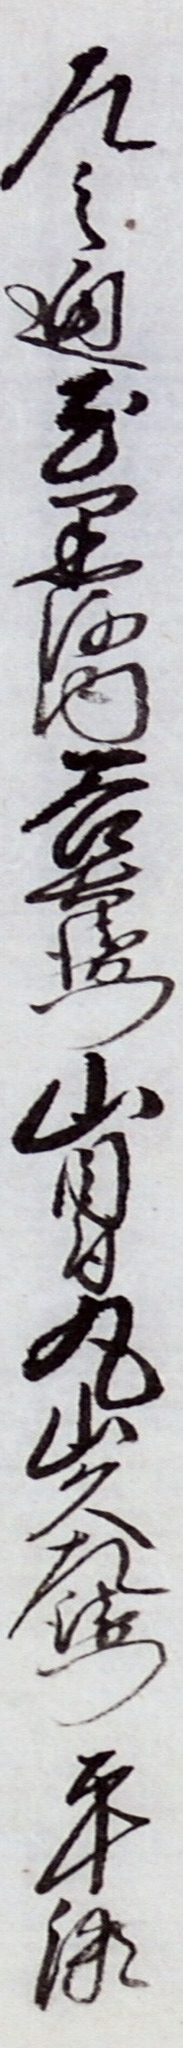左之通尤黒河内善右衛門山目付丸山久左衛門平瀬
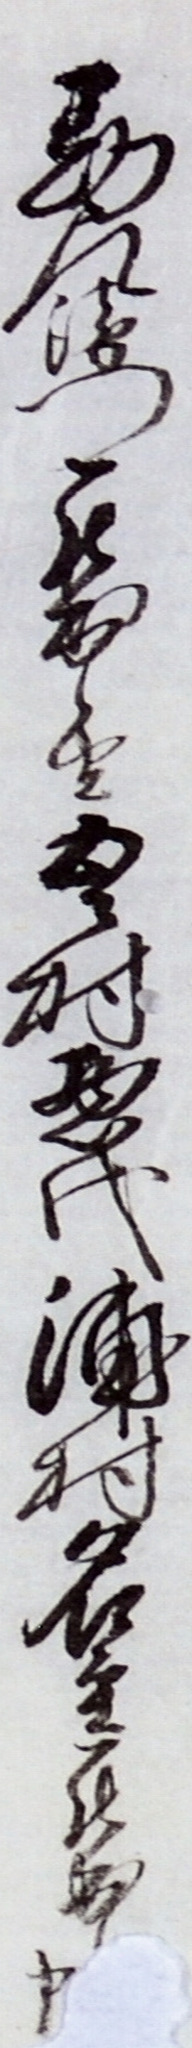勘左衛門罷出候由五ヶ村惣代浦村名主罷出申
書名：御山奉行御用控
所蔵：伊那市立高遠町図書館・合同会社AMANE
